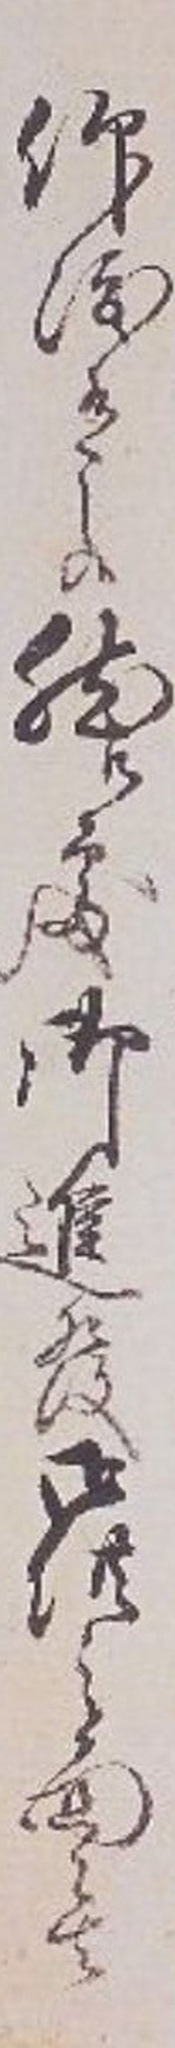仰儀有之候然る處御新発御供之面々は
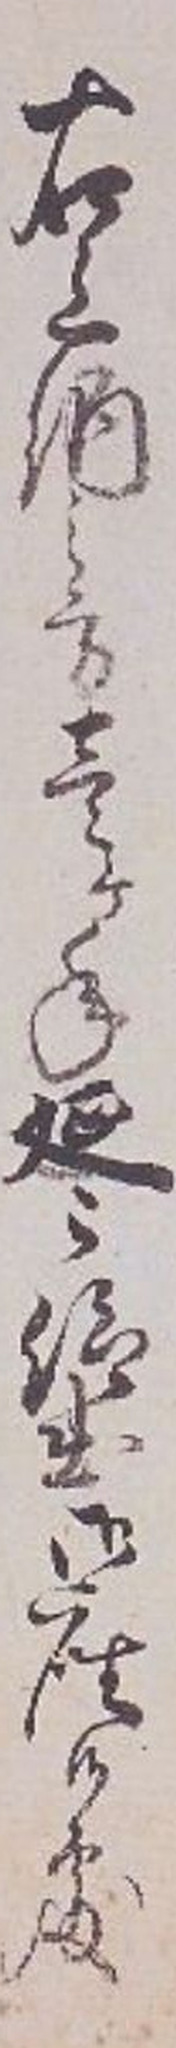右上納の方壱ヶ年延被仰出御座候處
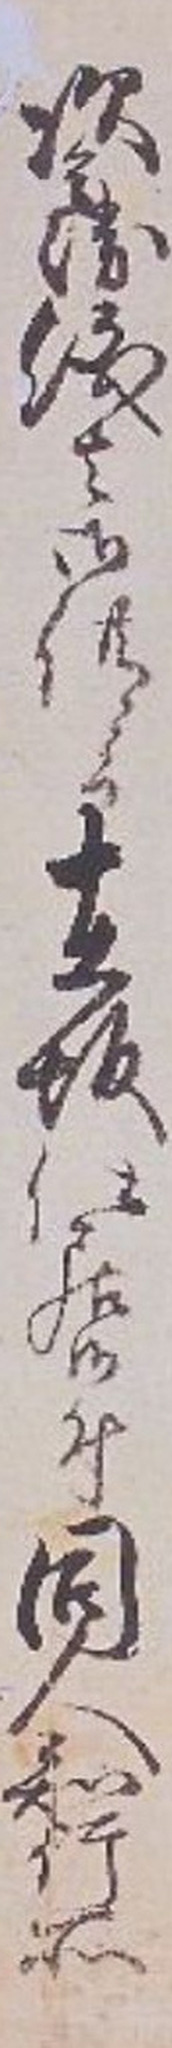治兵衛はお御供にて在坂仕居候付同人知行所

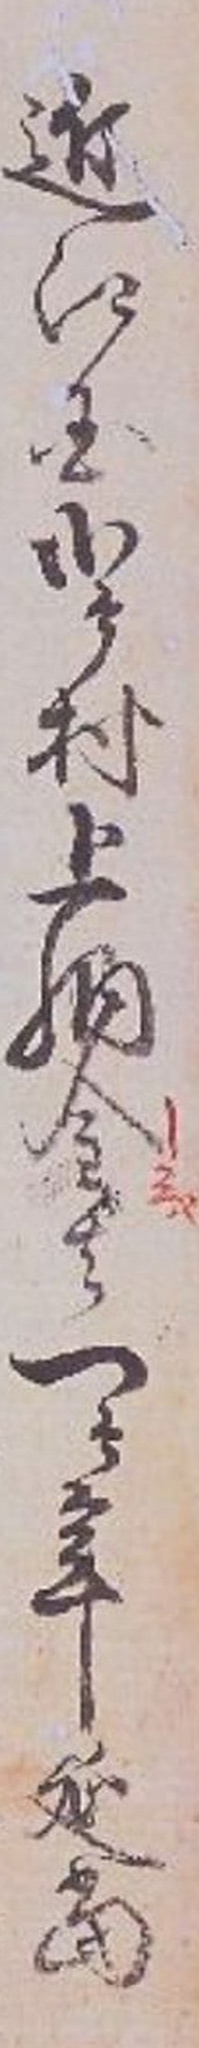近江国弐ヶ村上納金は一ヶ年延当
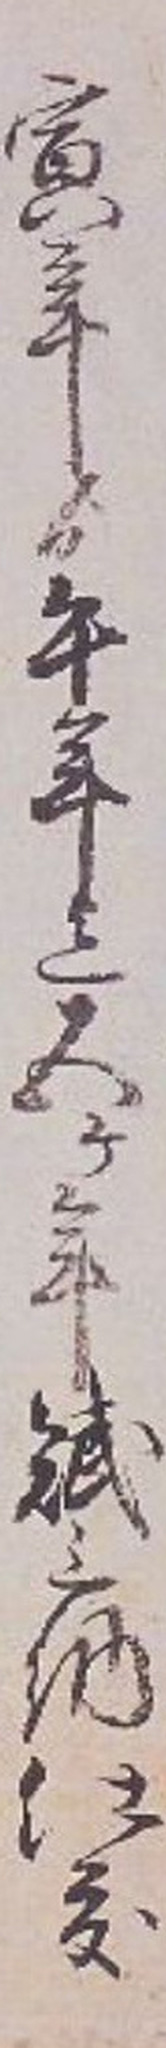寅年ゟ牛年迠五ヶ年賦上納仕度
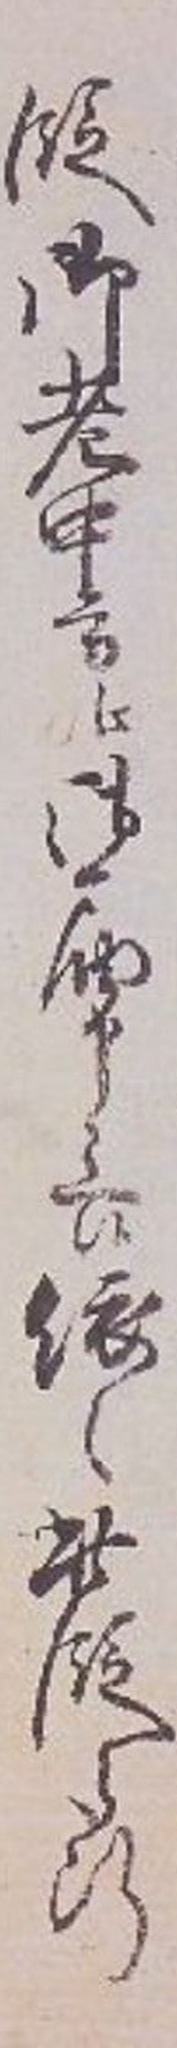段御老中方え御届申上候依之此段行
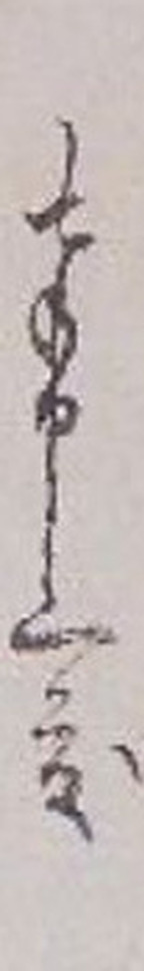奉申上度
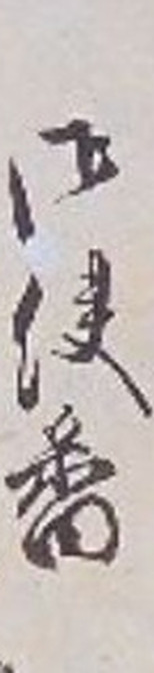御使番
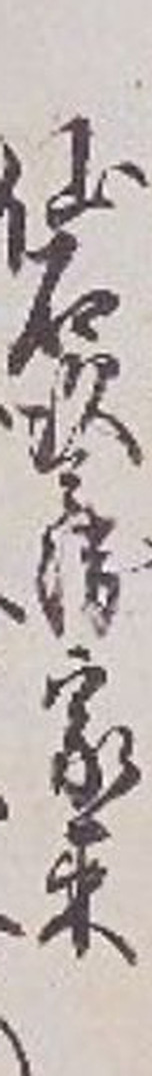仙石次兵衛家来
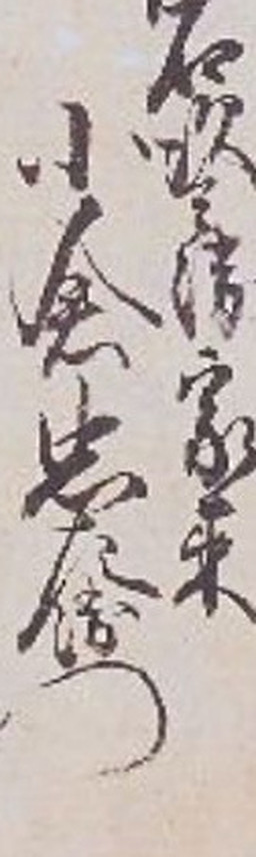小倉忠左衛門
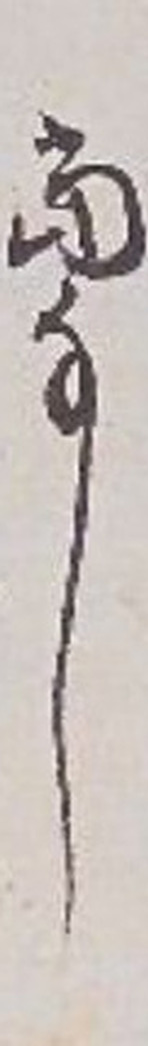当なし
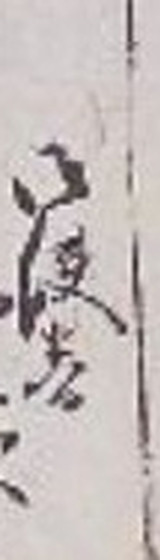御使番
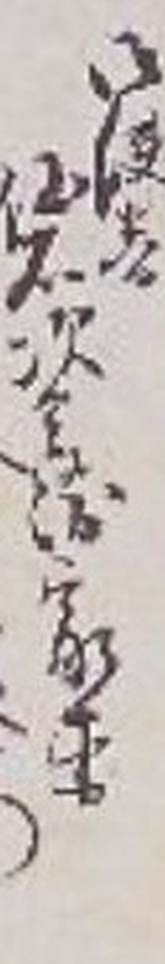仙石次兵衛家来
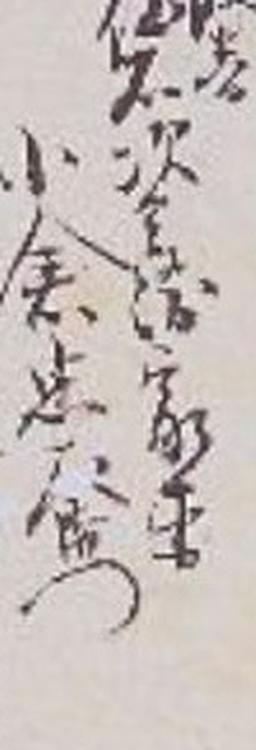小倉忠左衛門
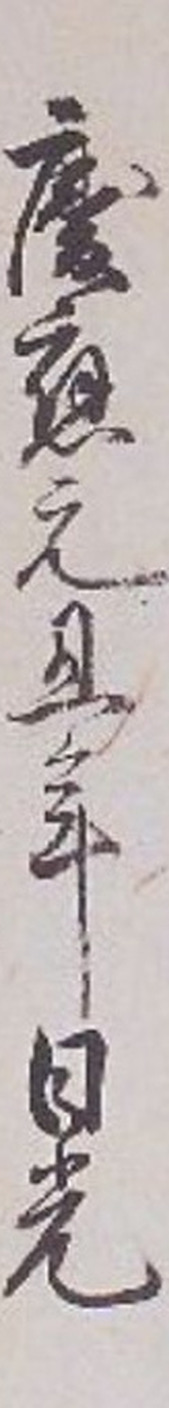慶応元丑年日光
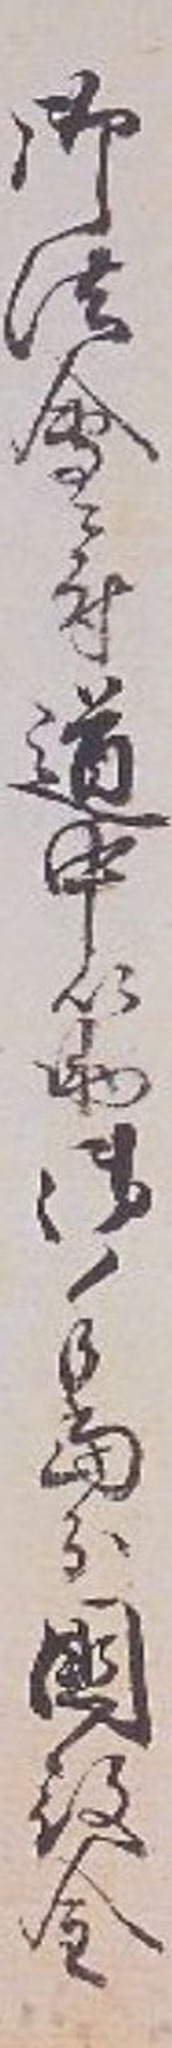御法会に付道中筋御手当分国役金
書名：琉球人帰国に付国役金の記録
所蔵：University of the Ryukyus Library
